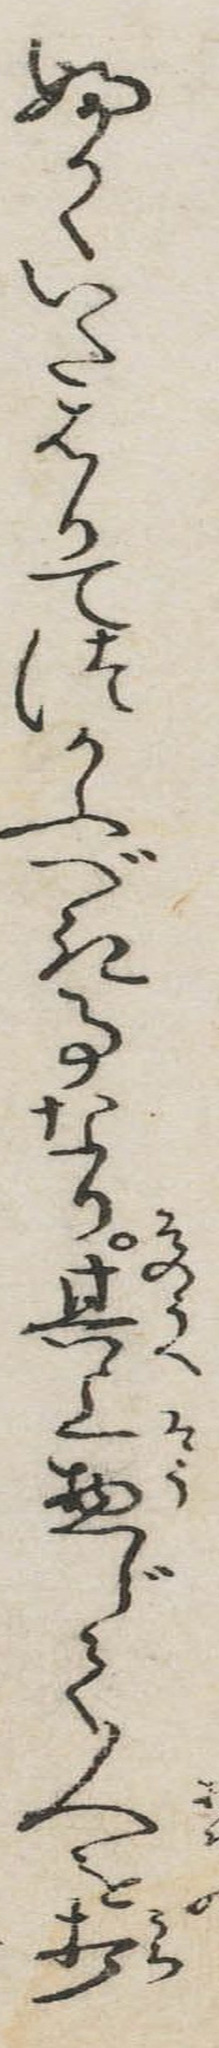ふかくいたはりてつかふべき事なり。其上惣じて人を打
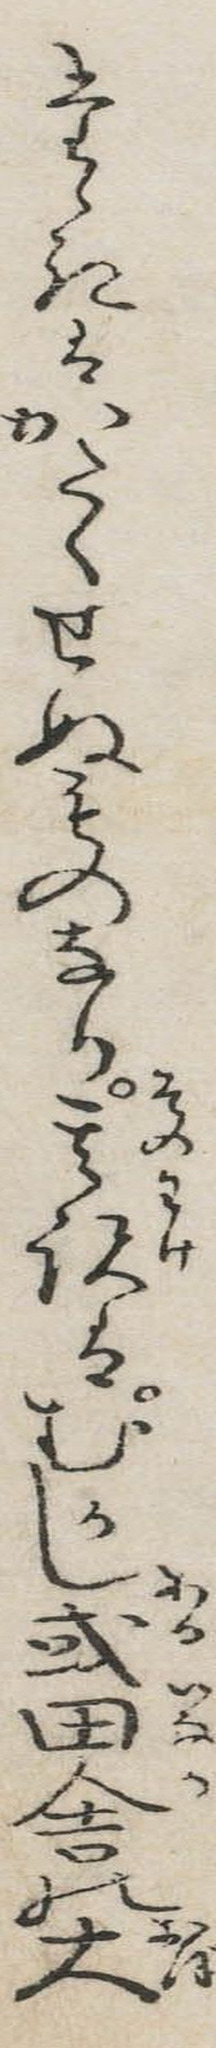たゝきはかたくせぬものなり。其訳は。むかし或田舎の大
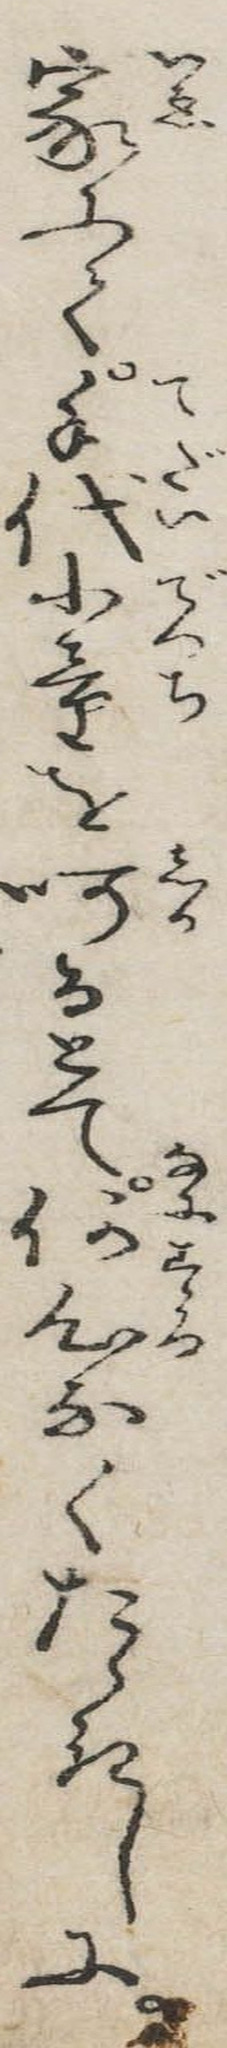家にて。手代小童を呵るとて。何心なくたゝきしに。
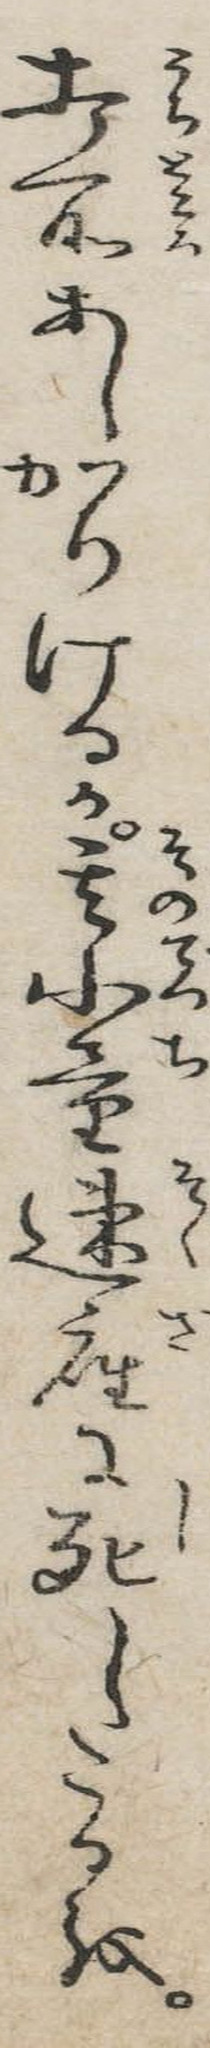打所あしかりけるか。其小童速座に死したるを。
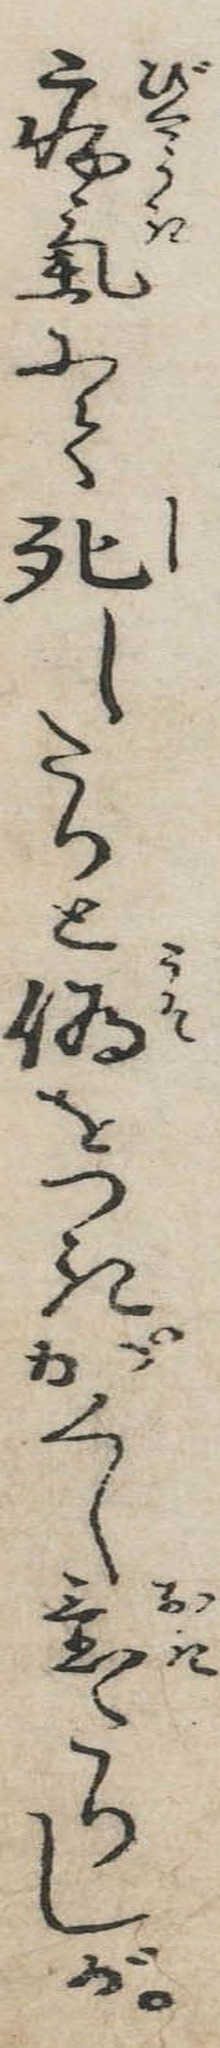病気にて死したりと偽をつき。かくし置たりしが。

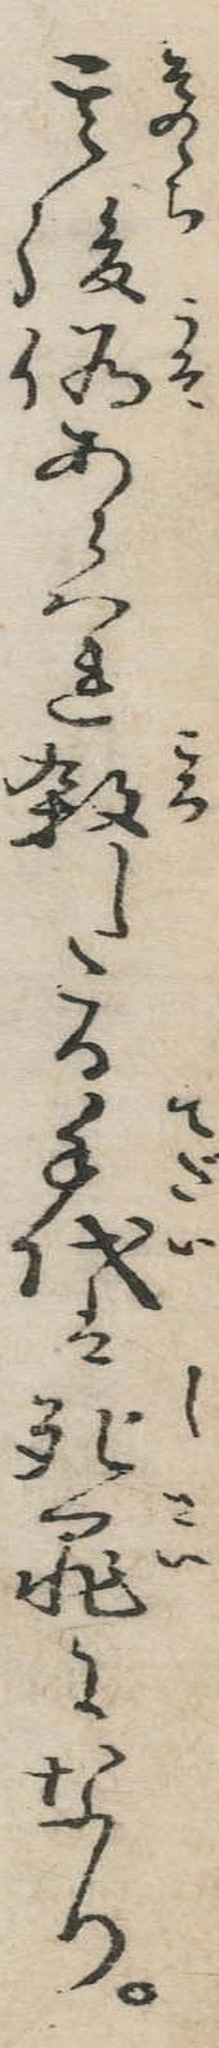其後偽あらはれ殺したる手代は死罪になり。
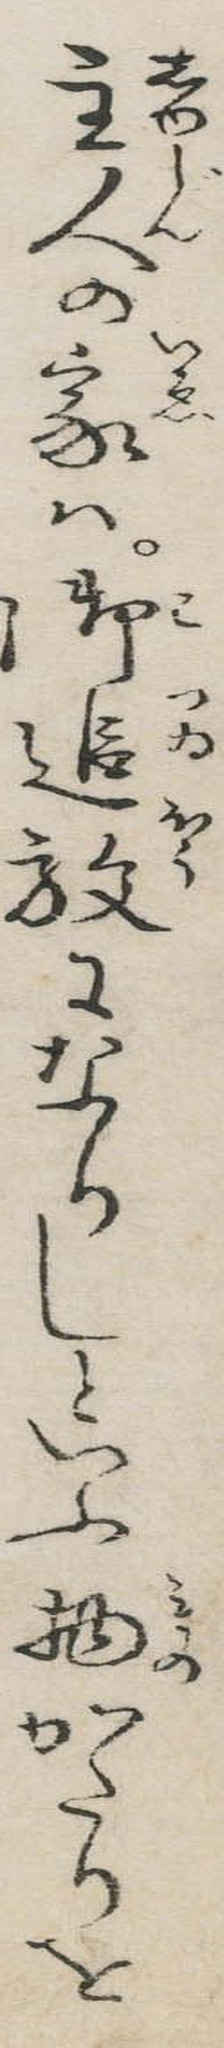主人の家は。御追放になりしといふ物かたりを
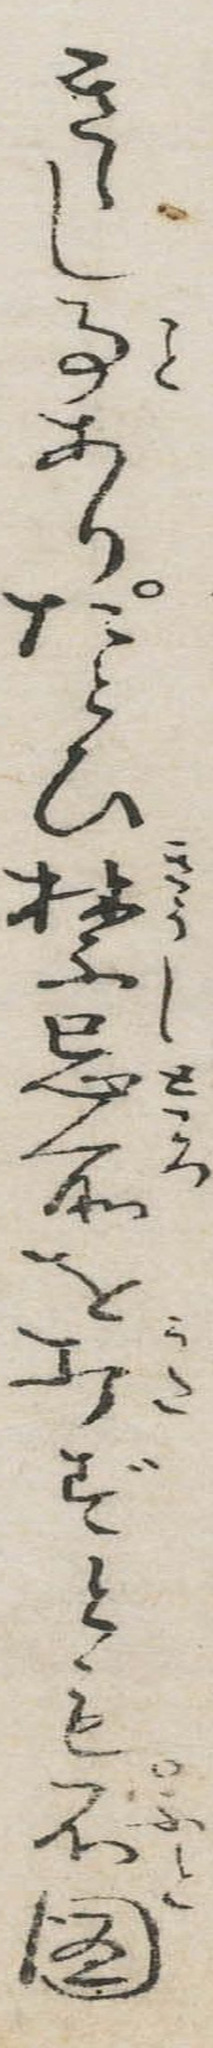きゝし事あり。たとひ禁忌所を打ずとも。不図
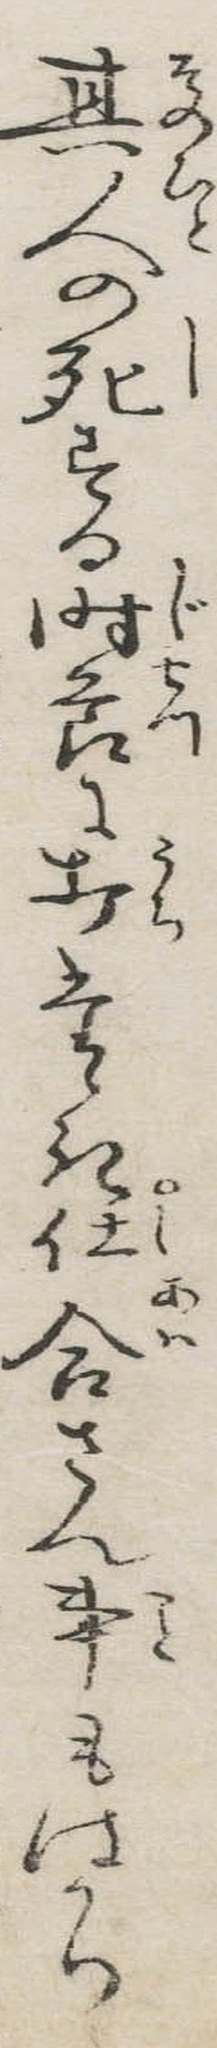其人の死する時節に打たゝき。仕合さん事もはかり
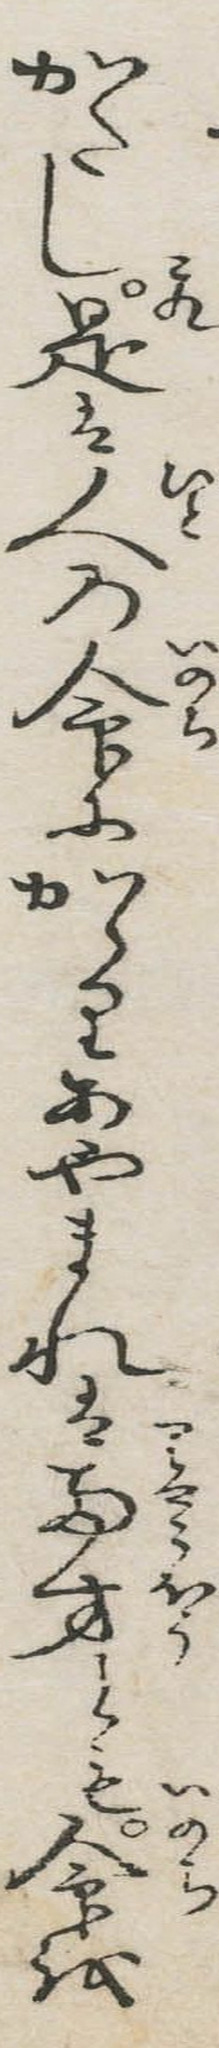かたし。是は人の命にかゝりあやまれは両方とも。命を
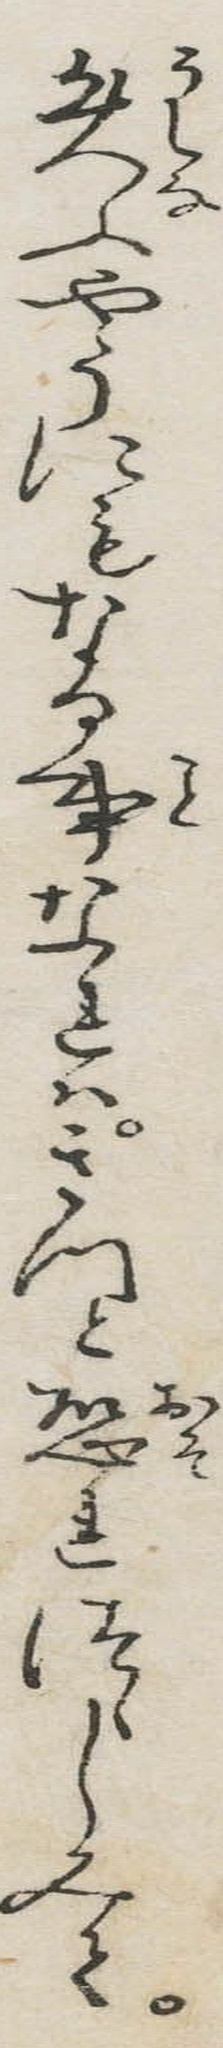失ふやうにもなる事なれは。きつと恐れつゝしみて。
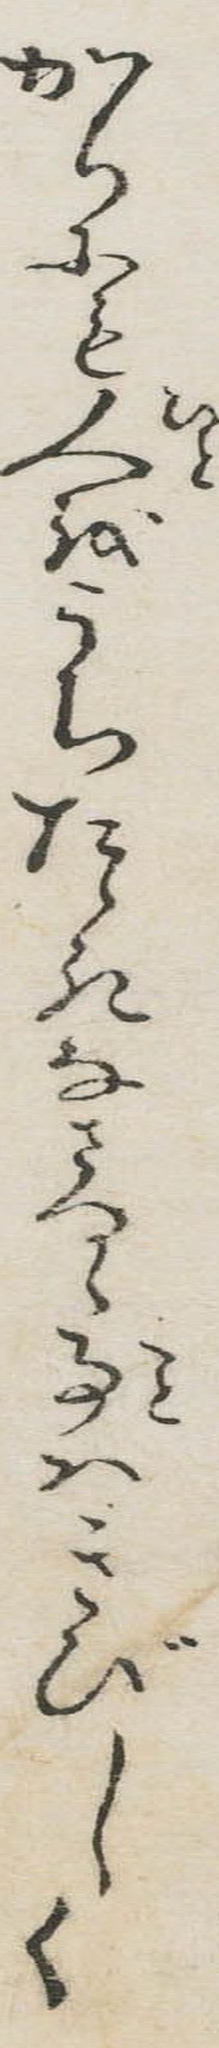かりにも人をうちたゝきなさるゝ事はきびしく
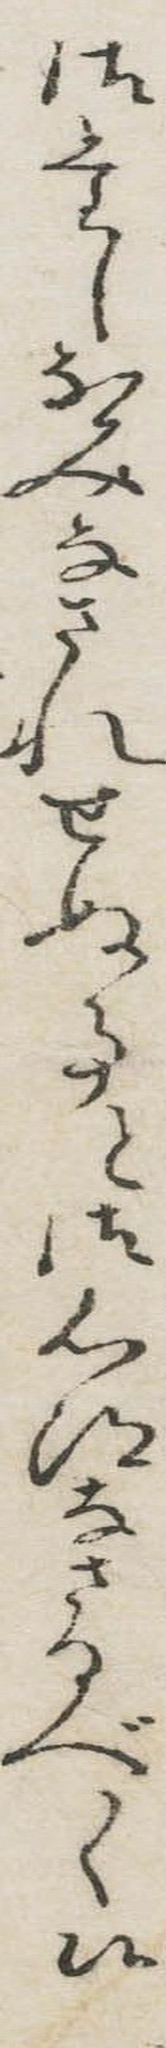御たしなみなされせぬ事と御心得なさるべく候
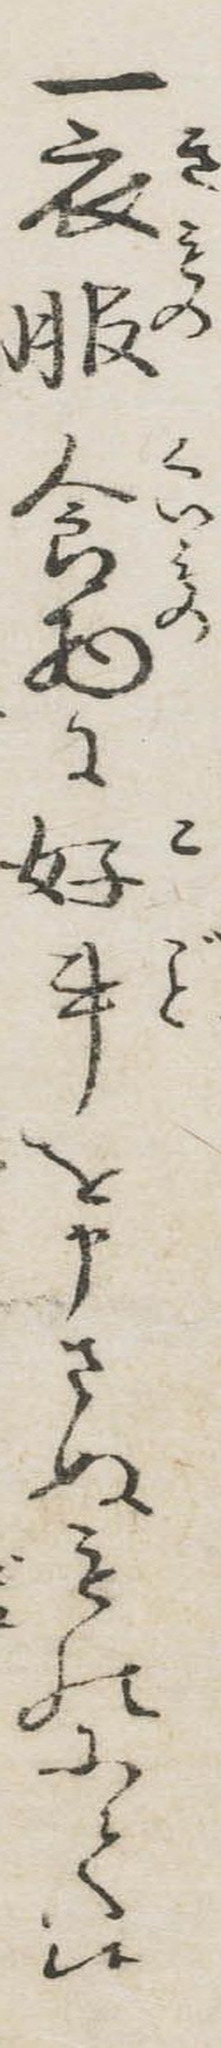一衣服食物に好事を申さぬものにて候
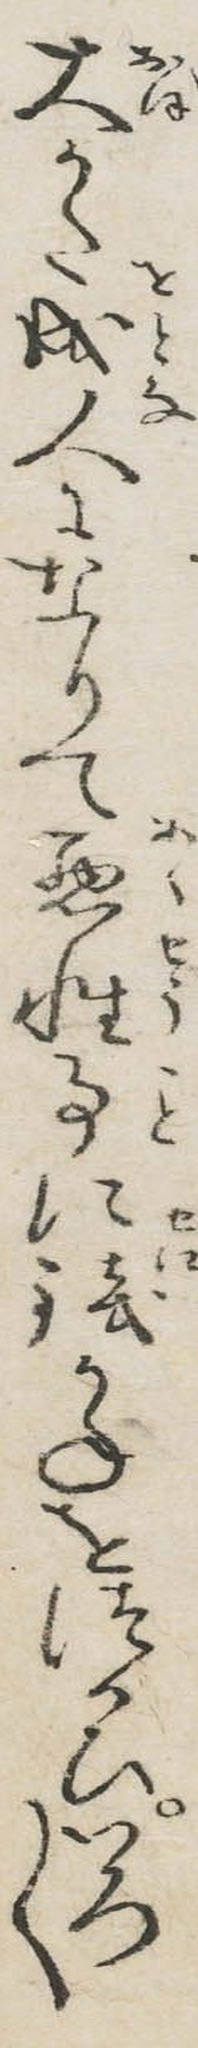大かた成人になりて悪性事に銭かねをつかひ。いろ〳〵
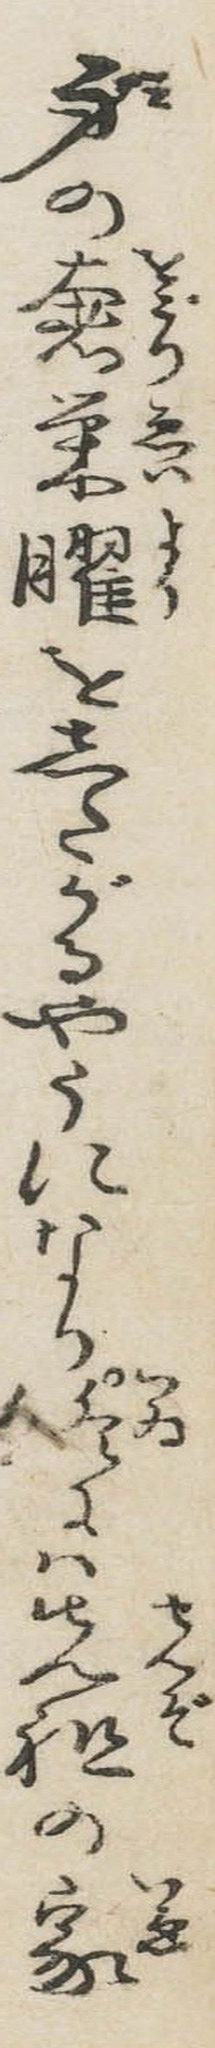身の奢栄曜をしたがるやうになり。終には先祖の家
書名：前訓
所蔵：東京学芸大学附属図書館
